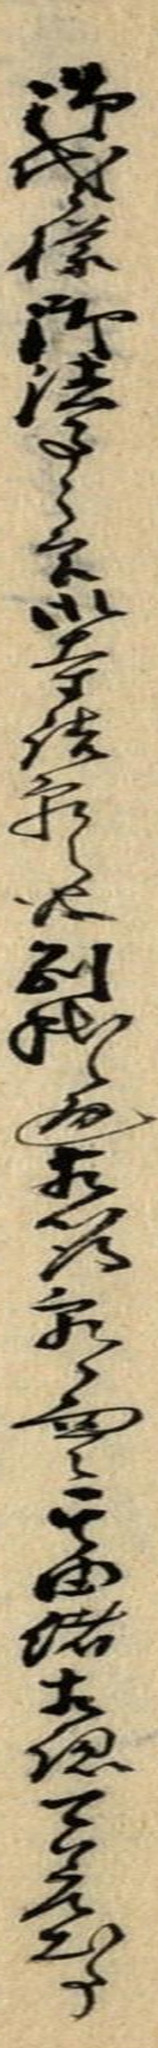御代々様御法事之節御寺詰願之儀別紙之通相心得願之面々其由緒相認可差出事
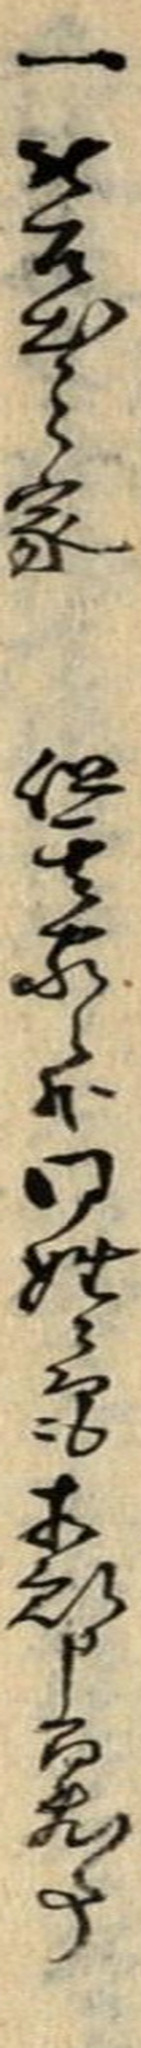一被召出候家但其家之外同姓に而も相願申間敷事
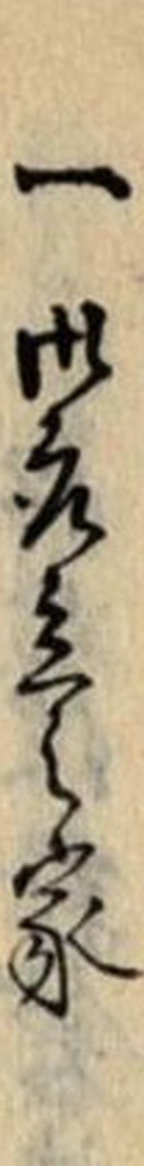一御取立之家
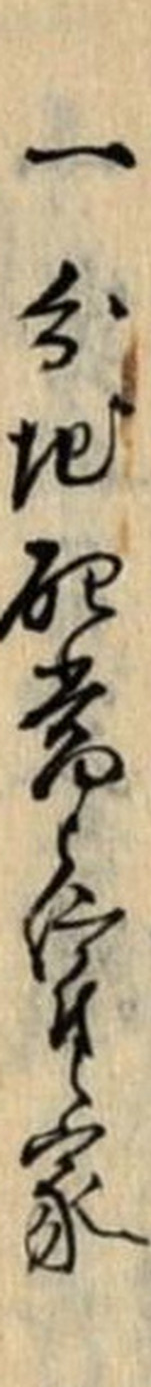一御加増被仰付候家
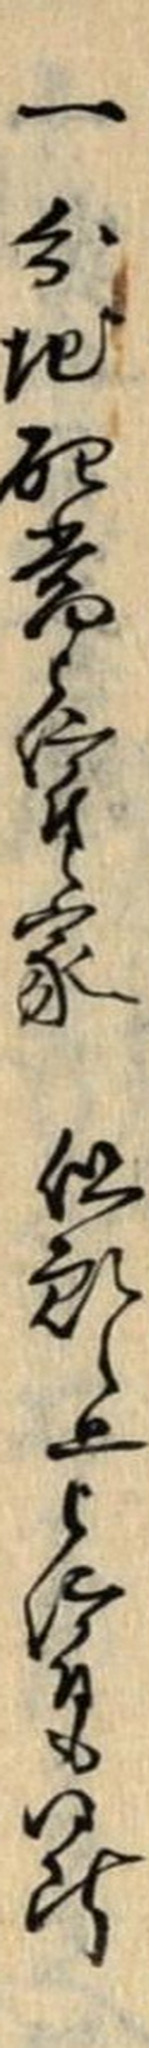一分地配当被仰付家但願之上被仰付も同断
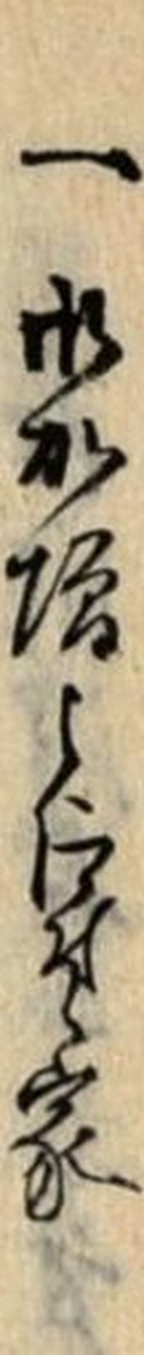一御加増被仰付候家
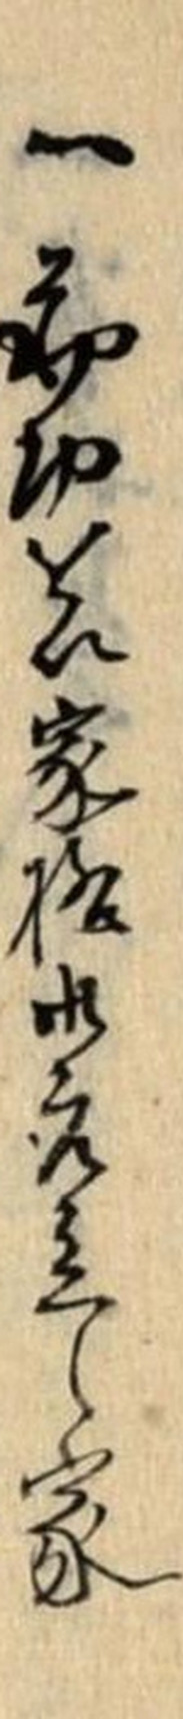一勤功を以家格御取立之家
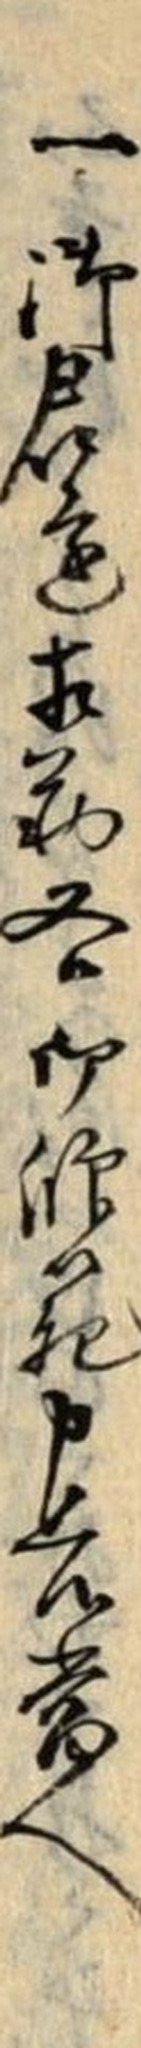一御君達相勤又は御師範申上候当人
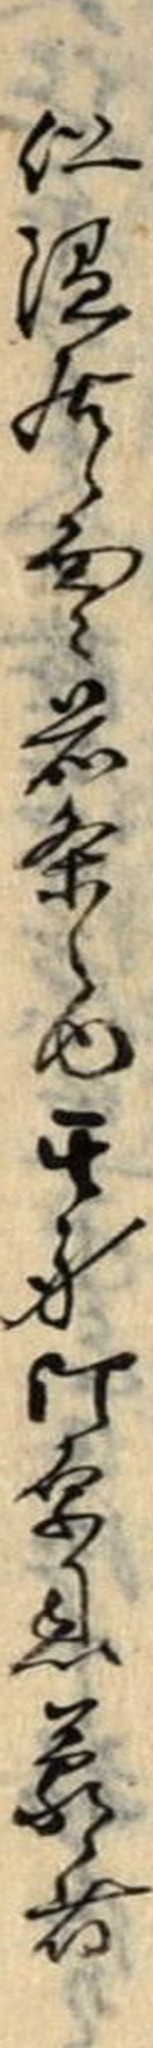但し隠居之面々前条之内其身御厚恩被候者
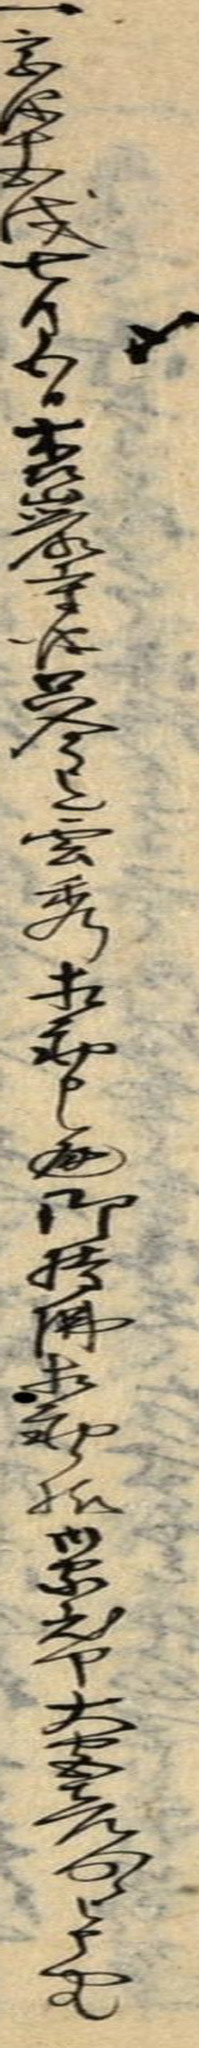一享保十五戌七月五日森巌寺儀只今迄雲秀相勤申通御持仏相勤候様御家老中大宮彦右衛門被申聞候
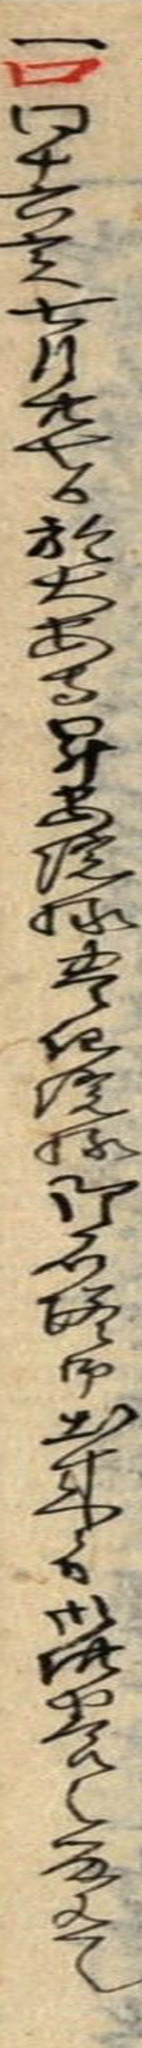一同十六亥七月廿七日於大安寺昇安院様豊仙院様御石碑御出来ニ付御供養之留有之

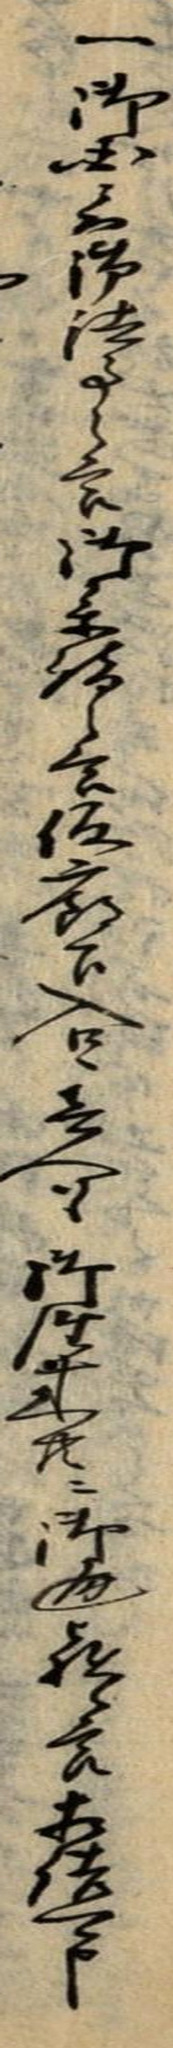一御国に而御法事之節御参詣之節仮廊下入口へ壱人つゝ御往来共に御通被遊候節相詰可申
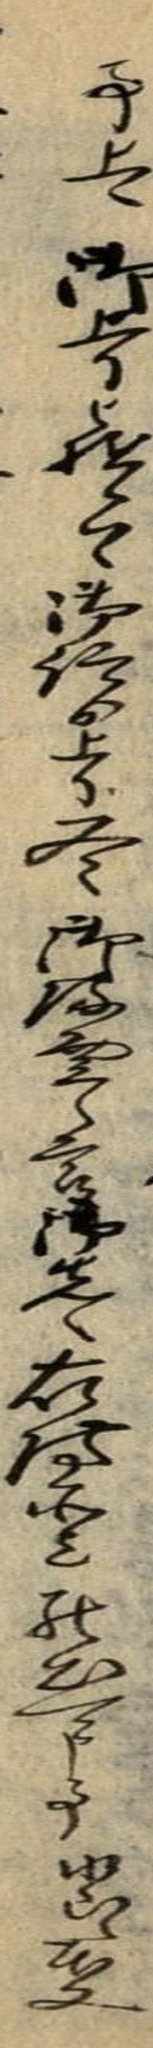事上候御上り被遊候はゝ御跡ゟ上り又々御帰殿之節御先へ右場所迄罷出可申事水玉之本文
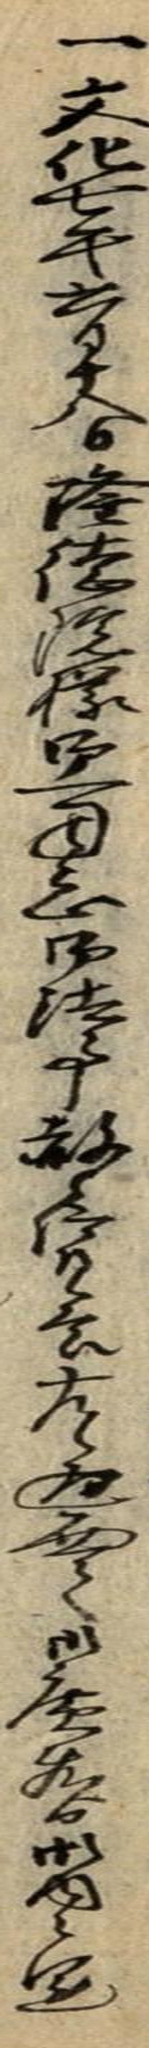一文化七午六月十八日隆徳院様御一周忌御法事赦被仰付候節左之通面々へ御広敷ゟ御内々運
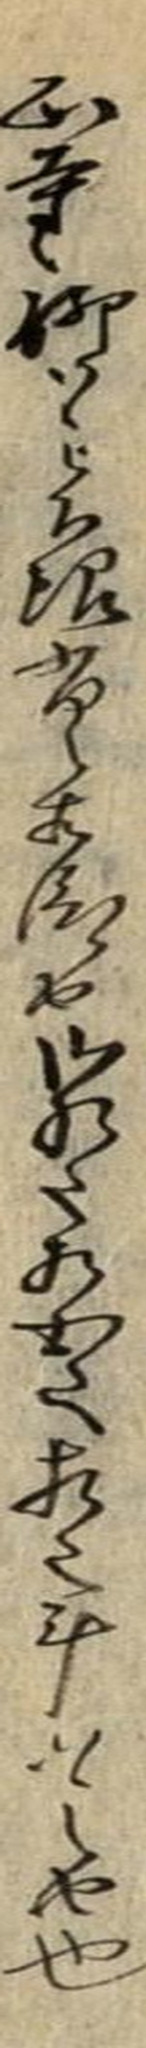正寺へ聊つゝ被下銀有之相渡候而弐拾匁拾五匁拾匁斗つゝ之由也
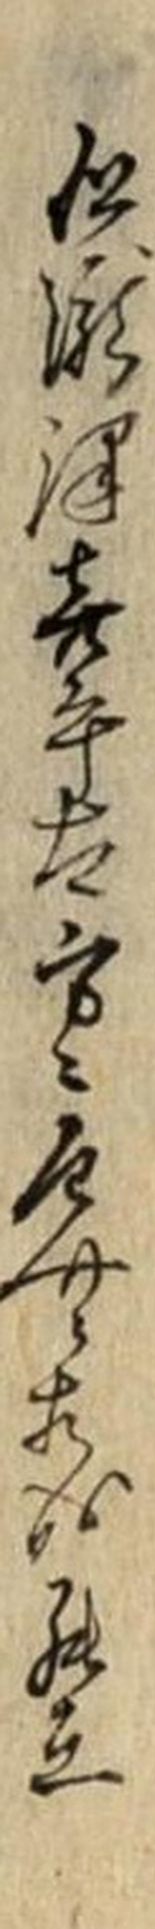但瀧澤喜平太方へ厄介に相成罷在
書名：蒐輯之部
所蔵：福井県文書館 Fukui Prefectural Archives
